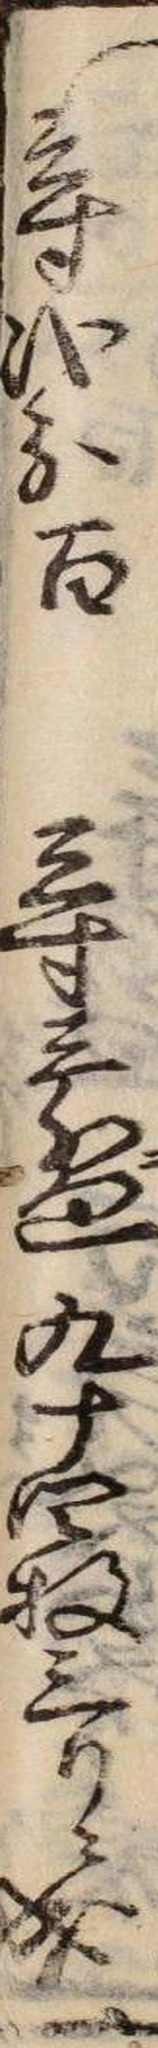三寸弐分百三寸三分に廻九十四枚三りに成
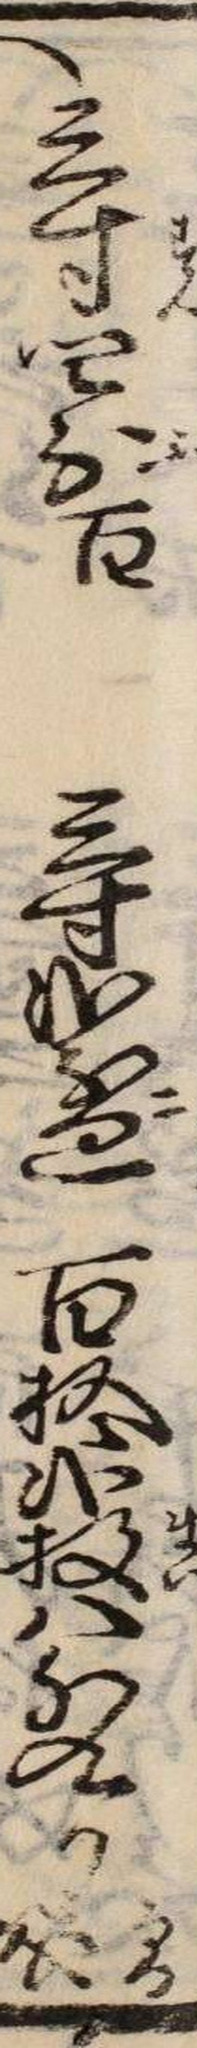三寸四分百三寸弐分に廻百拾弐枚八分九りに成
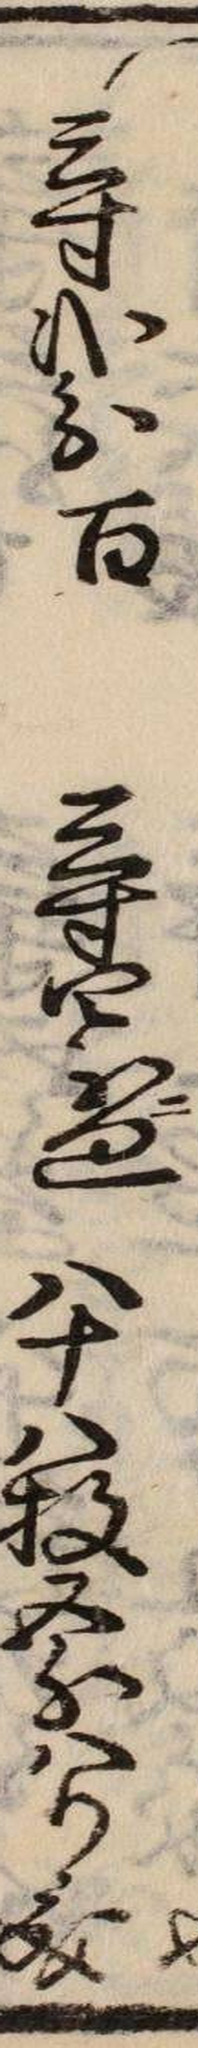三寸弐分百三寸四分に廻八十八枚五分八りに成
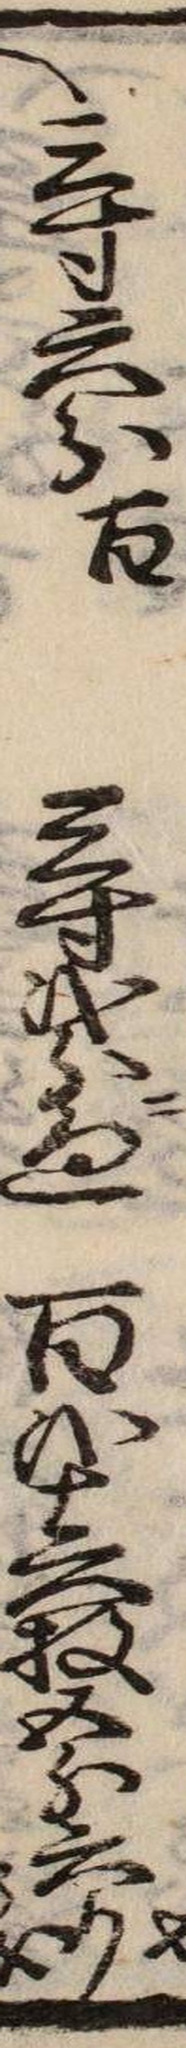三寸六分百三寸弐分に廻百弐十六枚五分六りに成
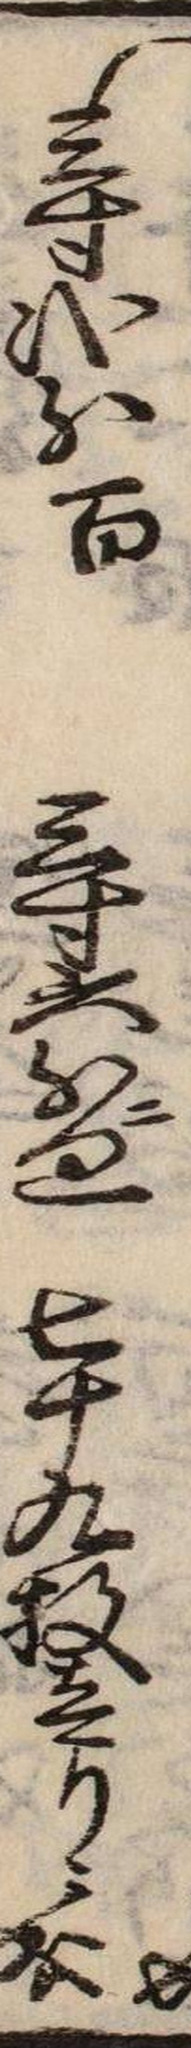三寸弐分百三寸六分に廻七十九枚壱りに成
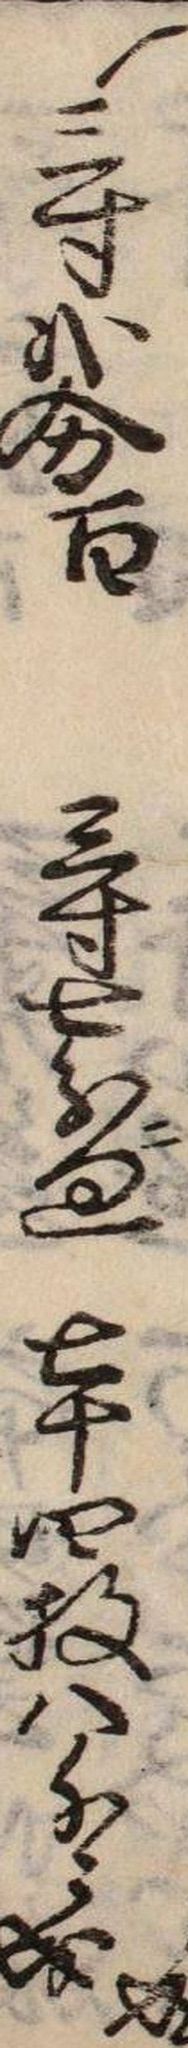三寸弐分百三寸七分に廻七十四枚八分に成
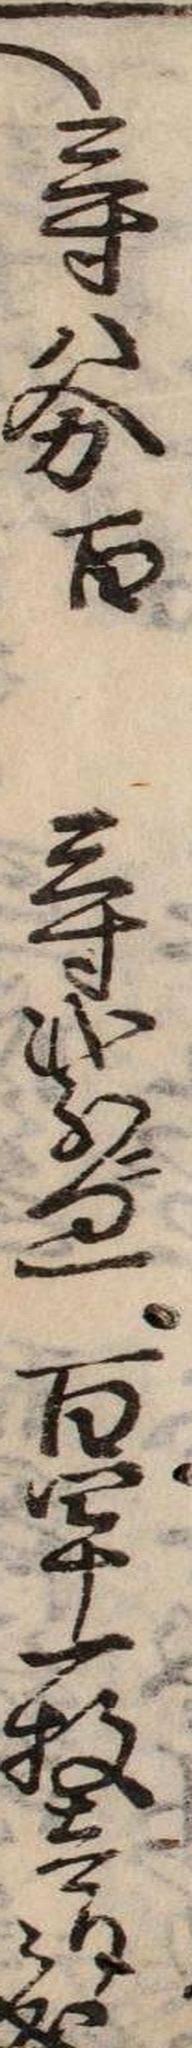三寸八分百三寸弐分に廻百四十一枚壱りに成

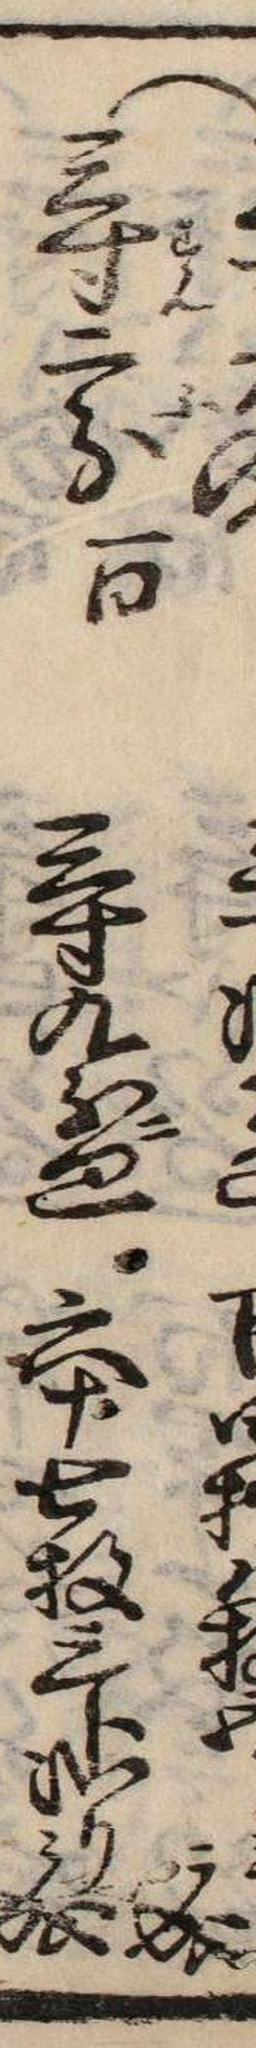三寸二分百三寸九分に廻六十七枚三分弐りに成
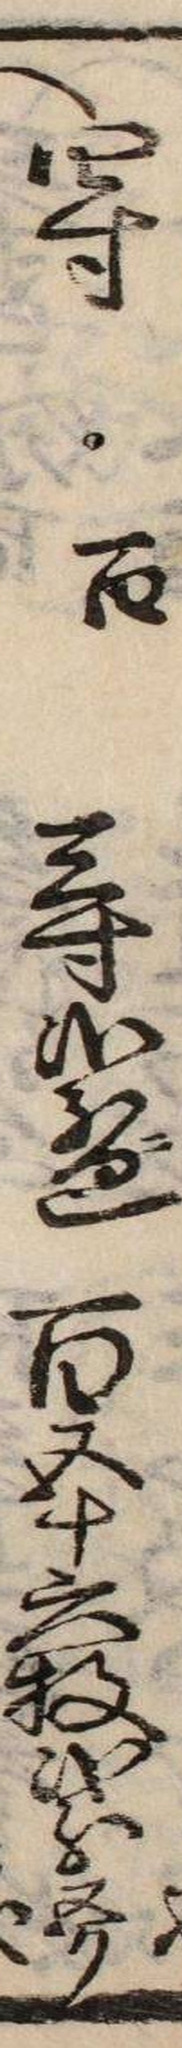四寸百三寸弐分に廻百五十六枚弐分五りに成
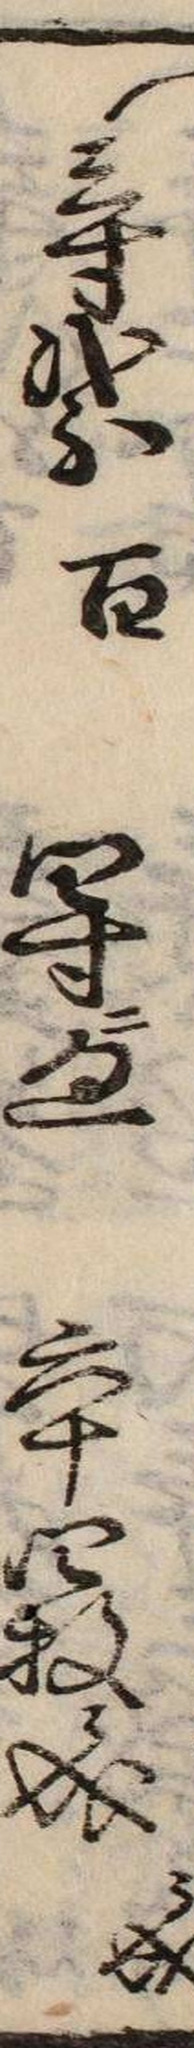三寸弐分百四寸に廻六十四枚に成
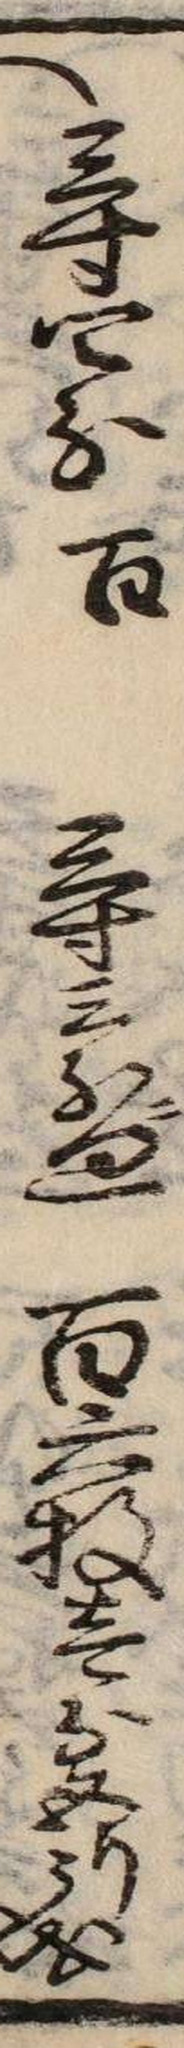三寸四分百三寸三分に廻百六枚壱分五りに成
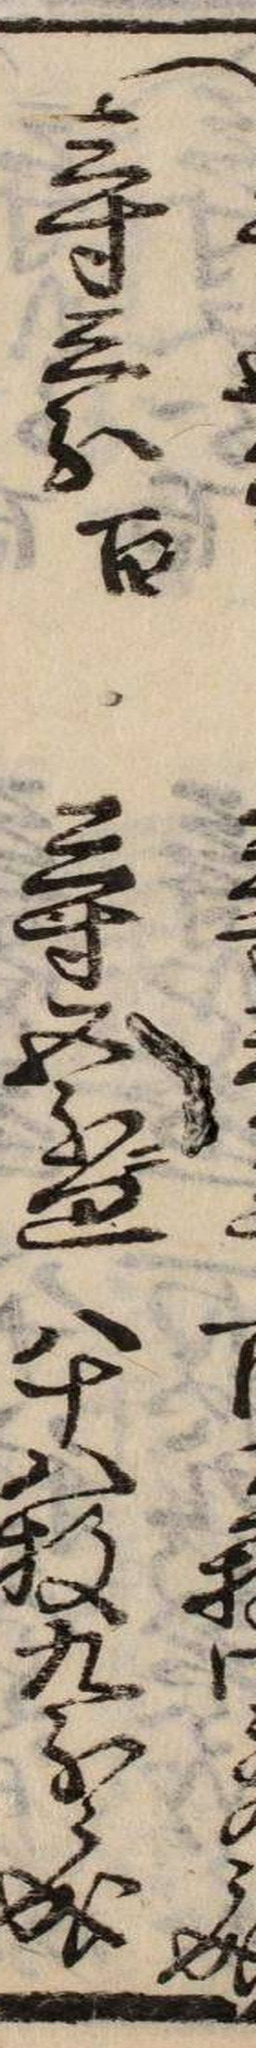三寸三分百三寸五分に廻八十八枚九分に成
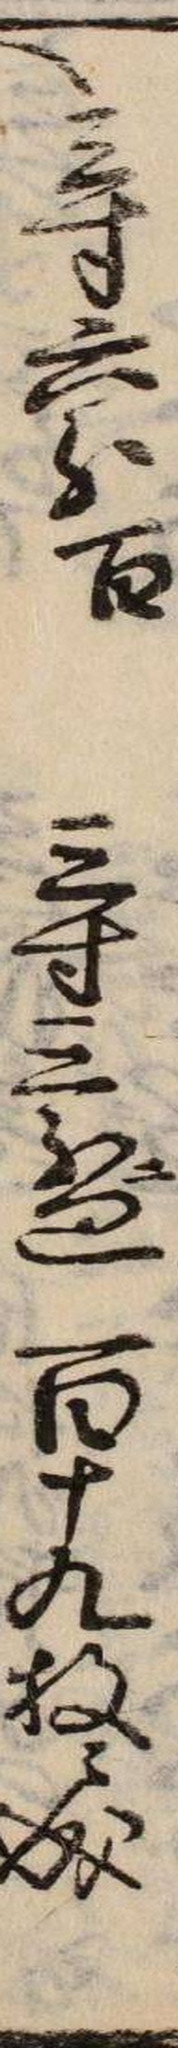三寸六分百三寸三分に廻百十九枚に成
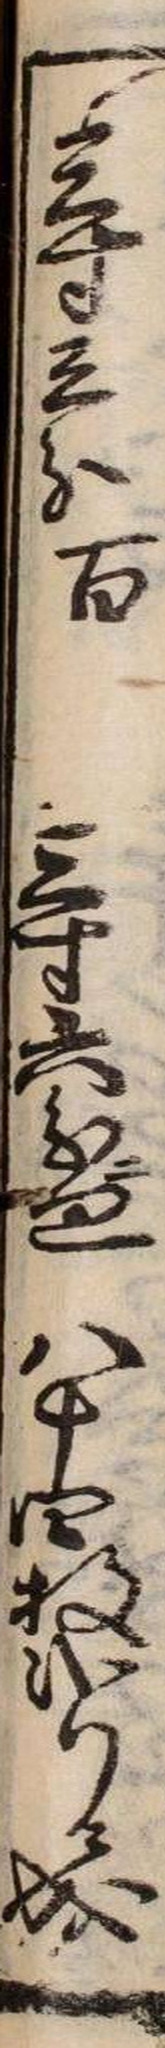三寸三分百三寸六分に廻八十四枚弐りに成
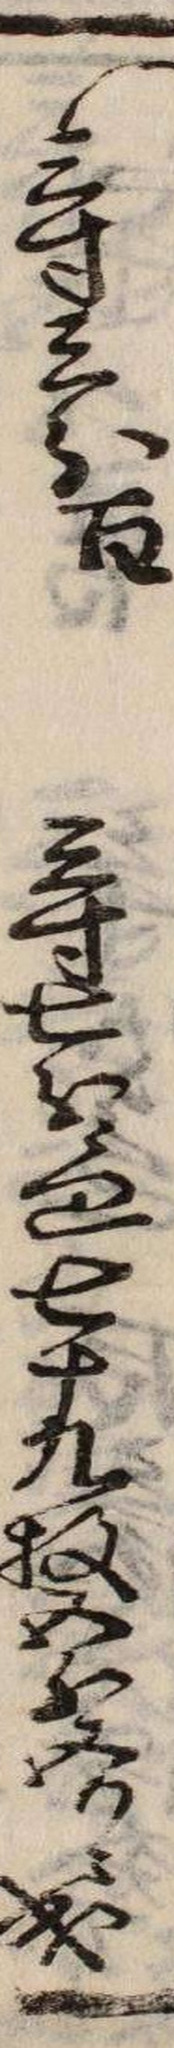三寸三分百三寸七分に廻七十九枚五分五りに成
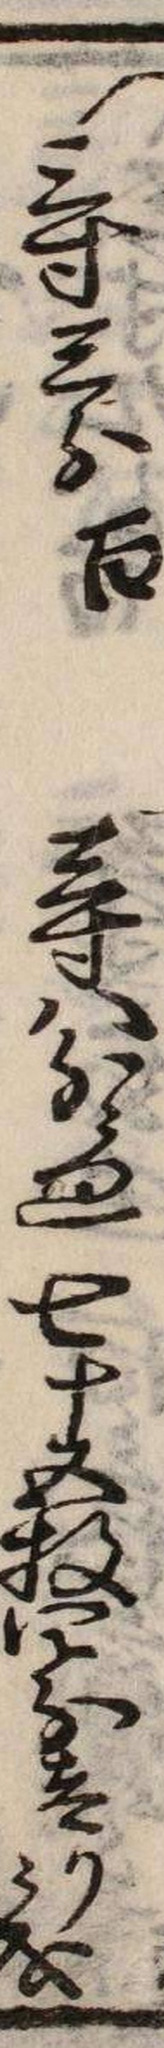三寸三分百三寸八分に廻七十五枚四分壱りに成
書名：塵劫記（寛永11年自跋、京都府立京都学・歴彩館追貴8）
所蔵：京都府立京都学・歴彩館 国文学研究資料館
